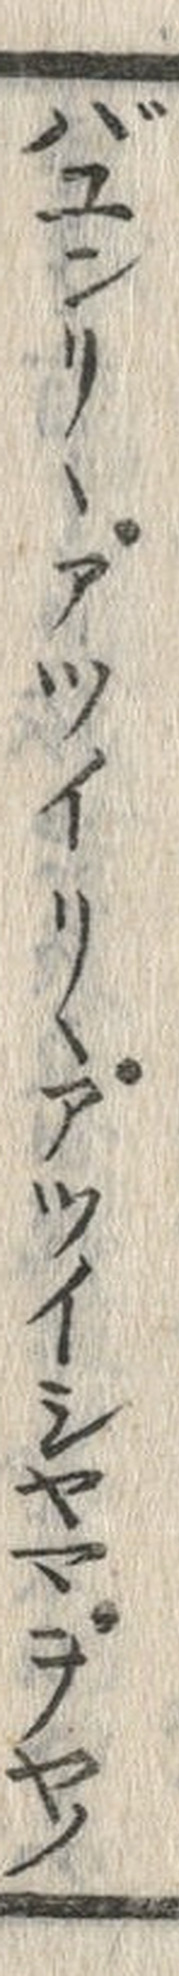バユンリヽ、アツイリヽ、アツイシヤマ。ヲヤノ
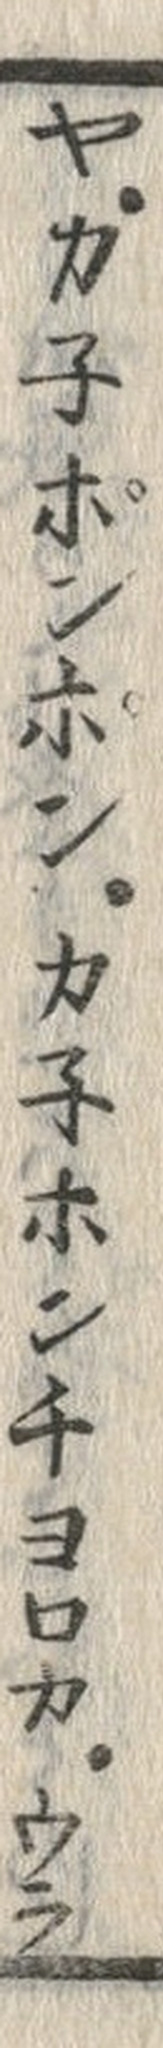ヤ。カネポンホン。カネホンチヨロカ。ウラ

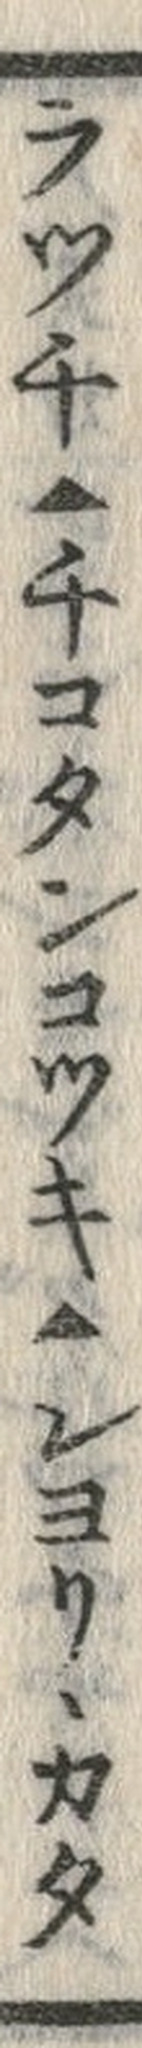ラツチ▲チコタンコツキ▲シヨリヽカタ
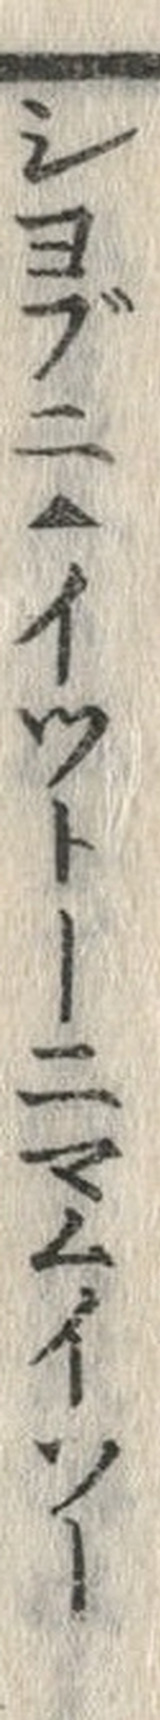シヨブニ▲イットーニマムイソー

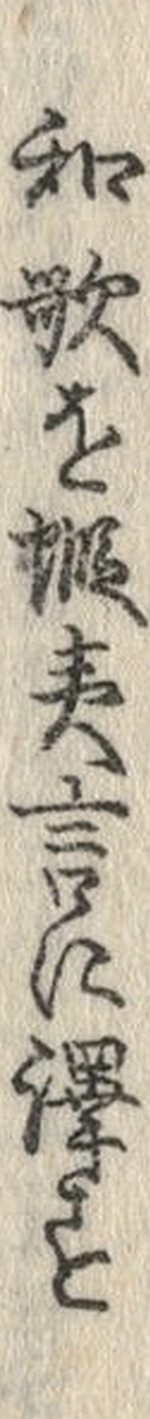和歌を蝦夷言に訳す
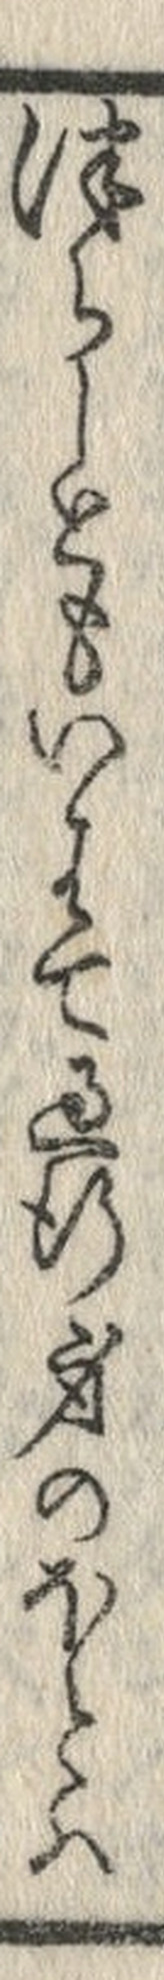つらしともいはて過行身のほとは
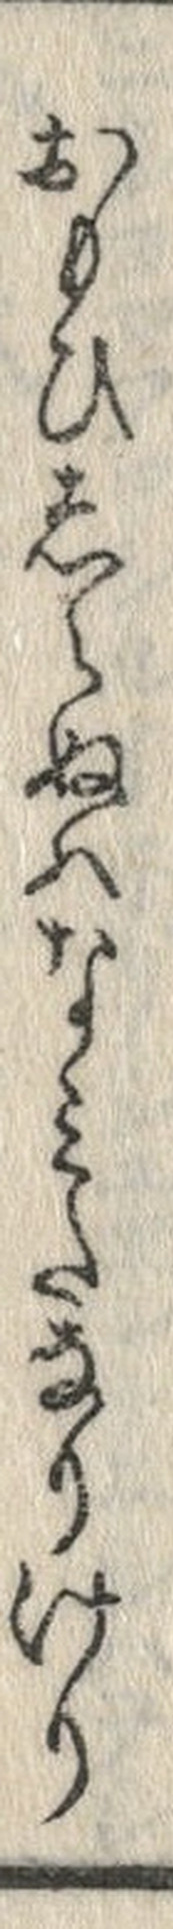おもひしらぬはなみたなりけり
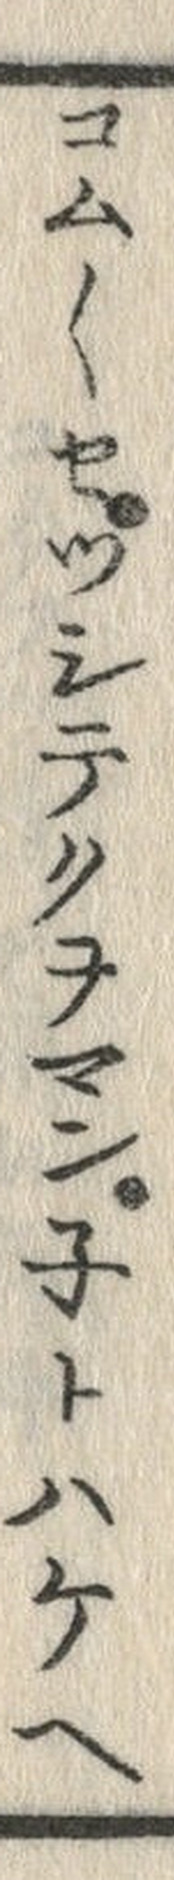コム〳〵セ。ツシテクヲマン。子トハケヘ
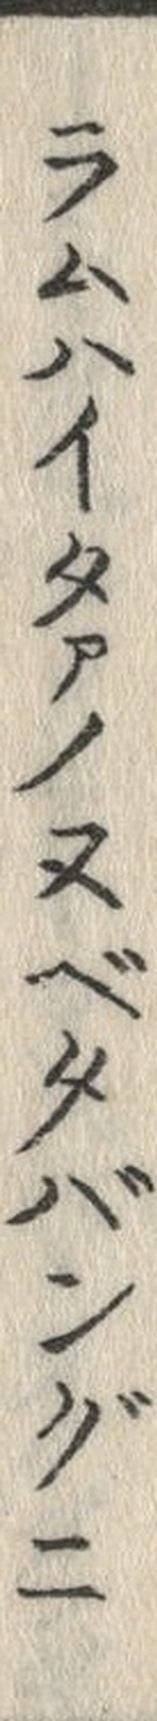ラムハイタアノヌベタバングニ
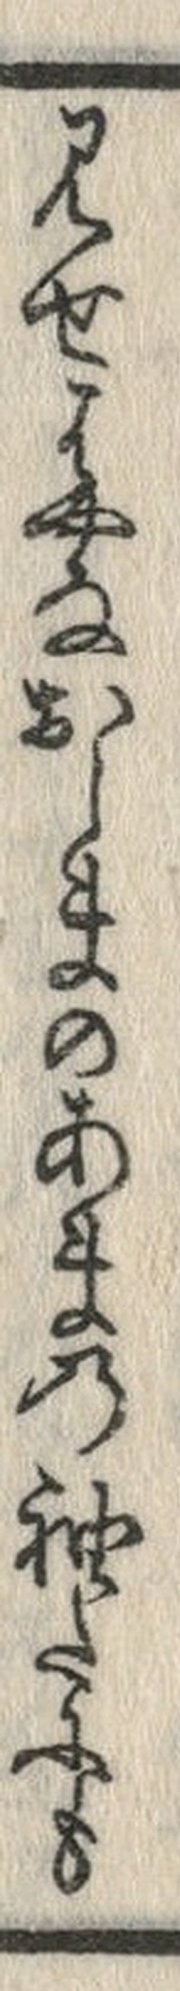見せはやなおしまのあまの袖たにも
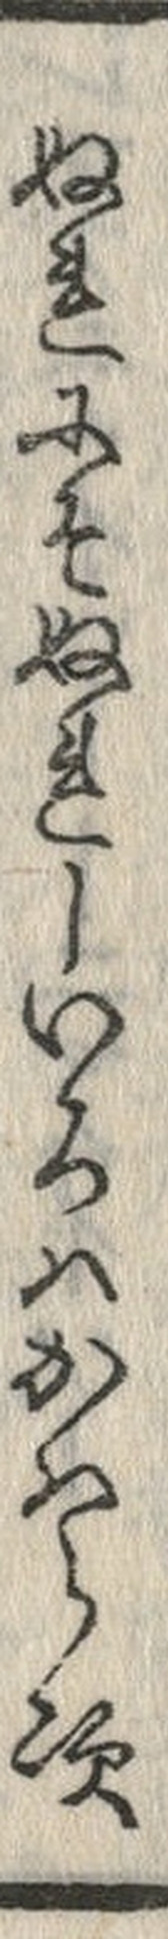ぬれにそぬれしいろはかはらす
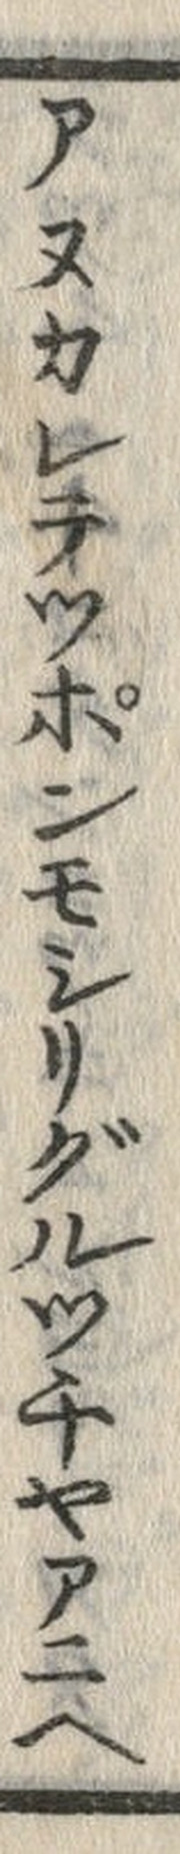アヌカレテツポンモシリグルツチヤアニヘ

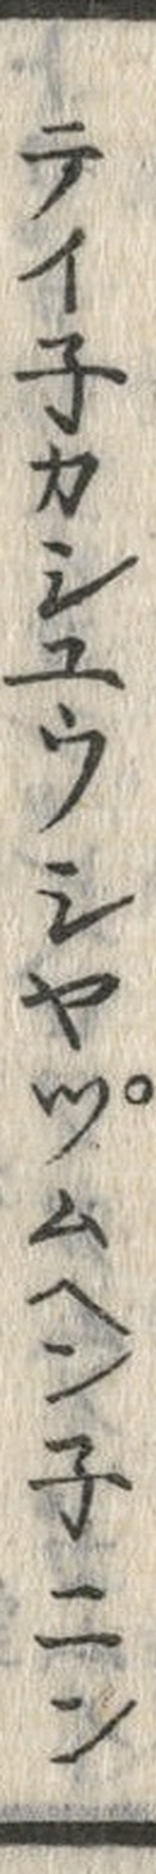テイネカシユウシヤツ゚ムヘン子ニン
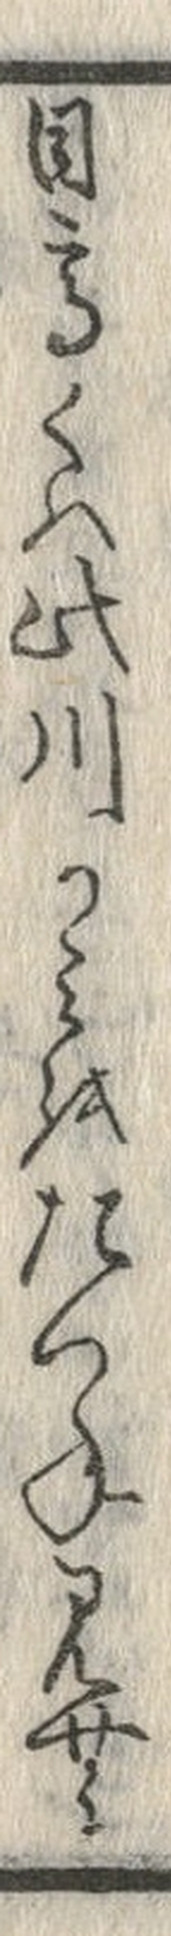目高くは此川かみをたつね見む
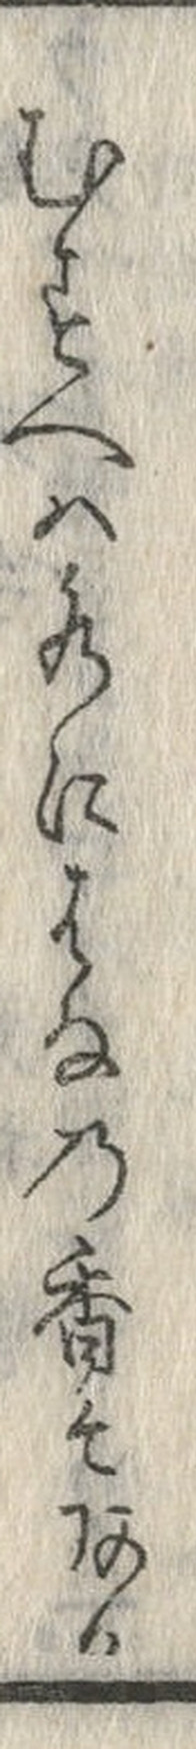むすへは水にはなの香そある
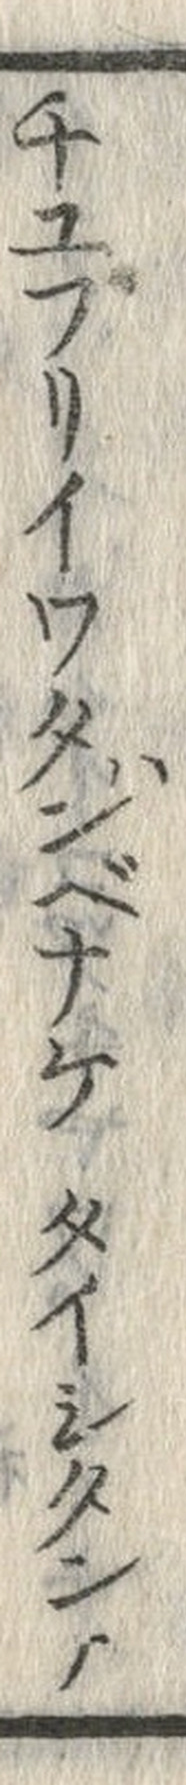チユプリイワタンベナケタイシタンノ
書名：蝦夷方言藻汐草　坤巻
